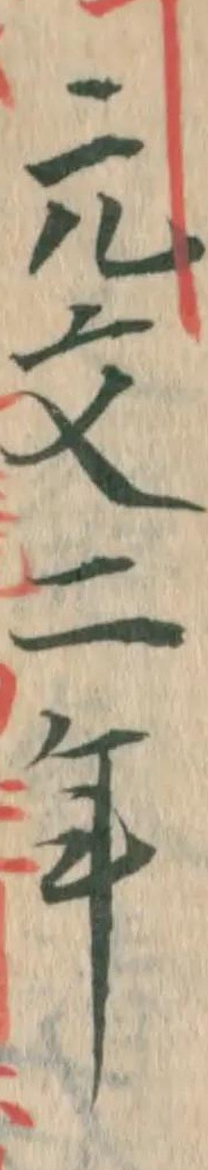元文二年
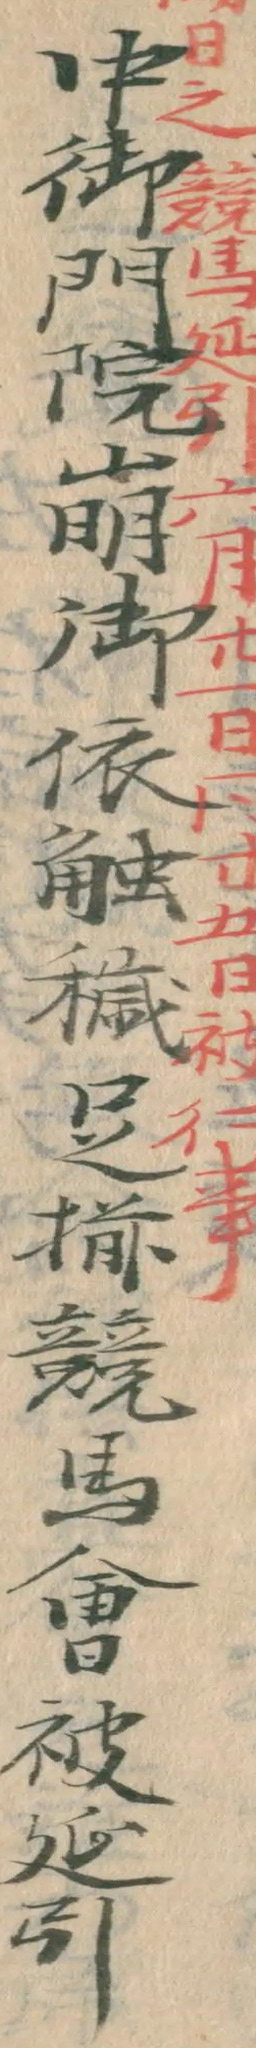中御門院崩御依触穢足揃競馬会被延引
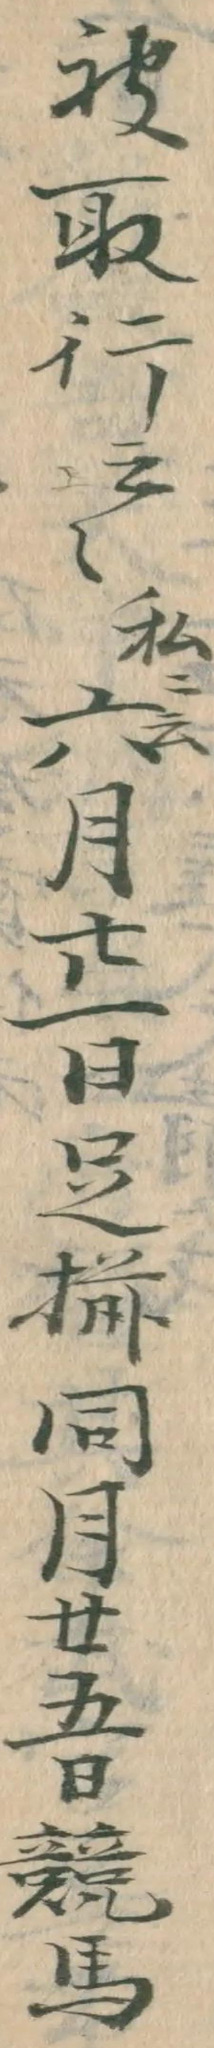被取行云々六月廿一日足揃同月廿五日競馬
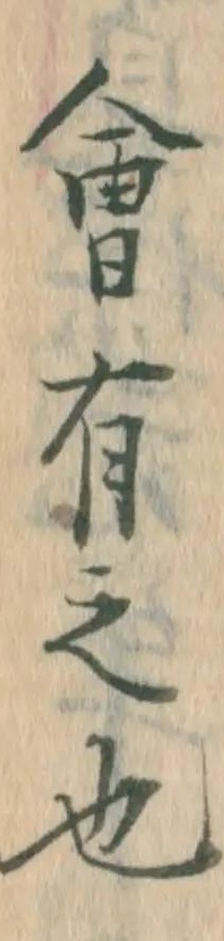会有之也

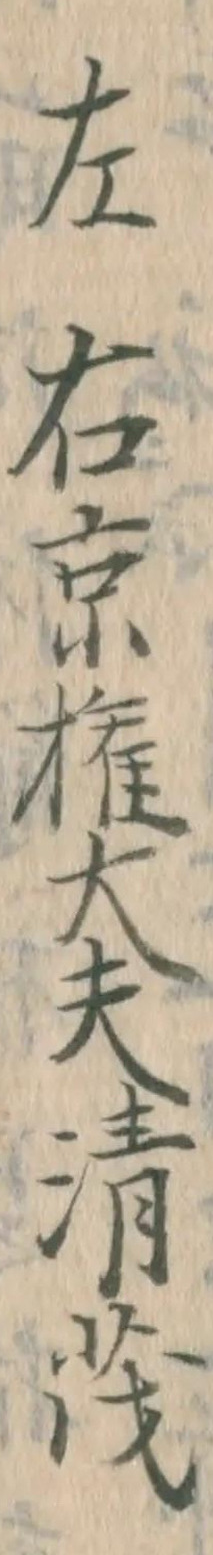左右京権大夫清茂
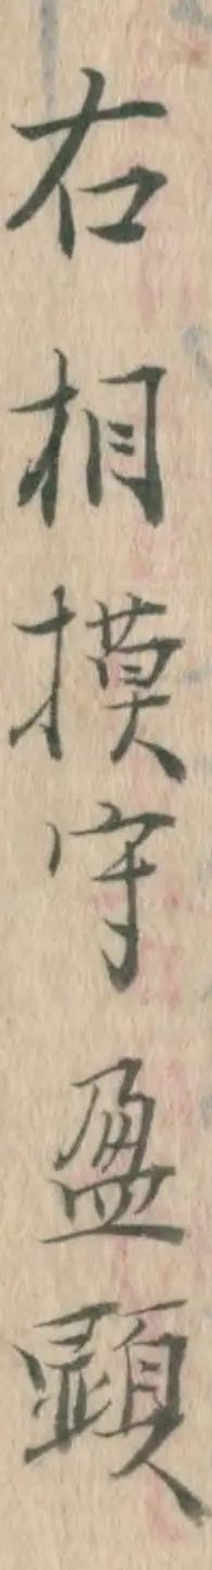右相模守盈顕
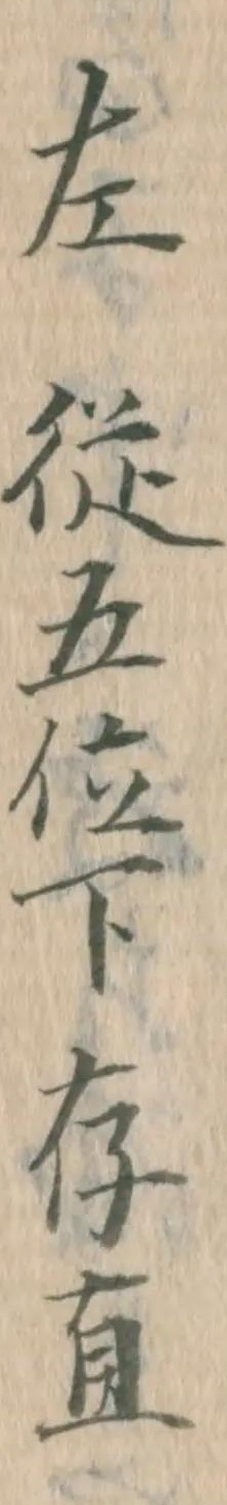左従五位下存直
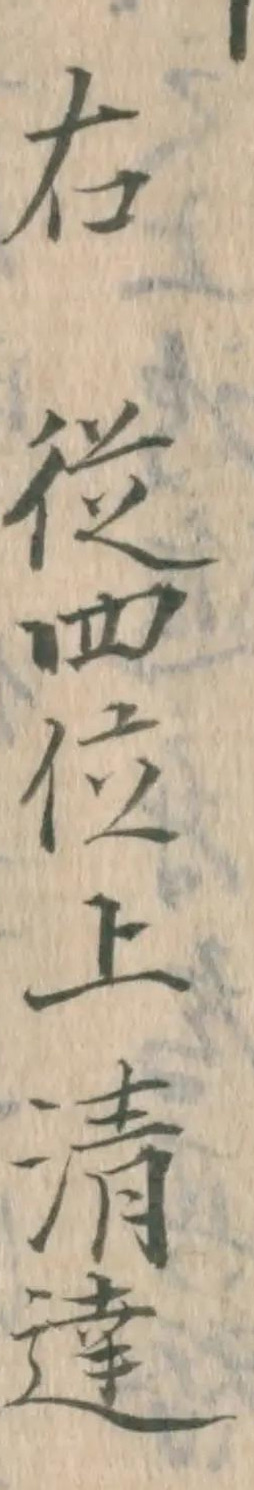右従四位上清達
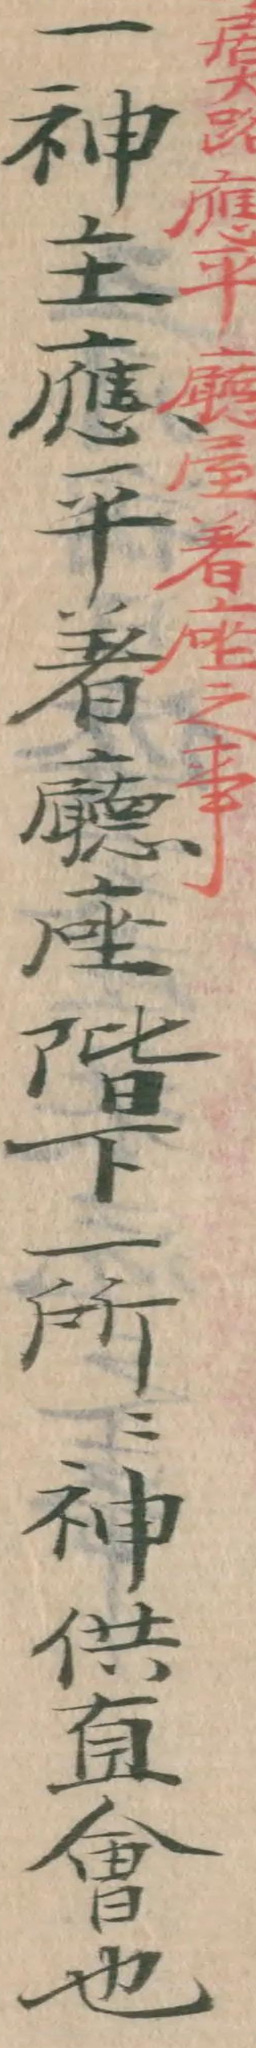一神主応平着庁座階下一所ニ神供真会也
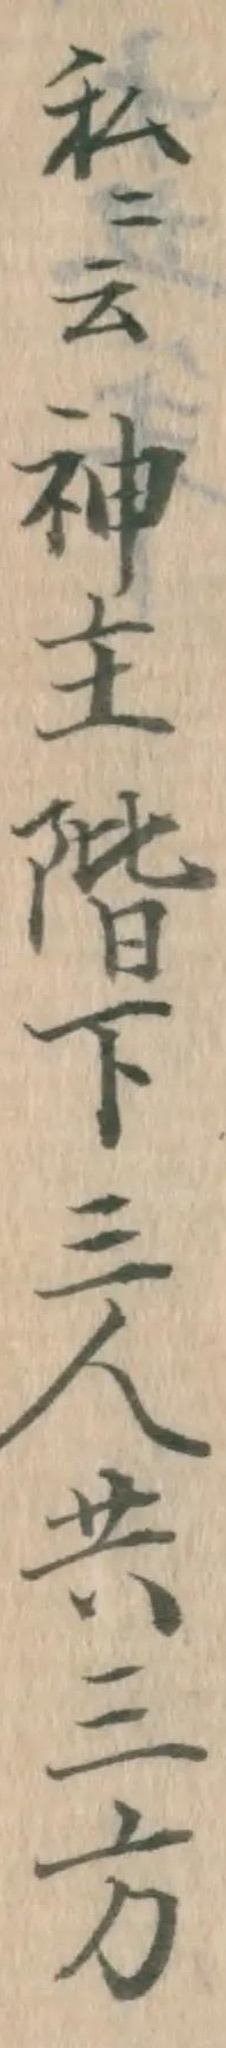私ニ云神主階下三人共三方
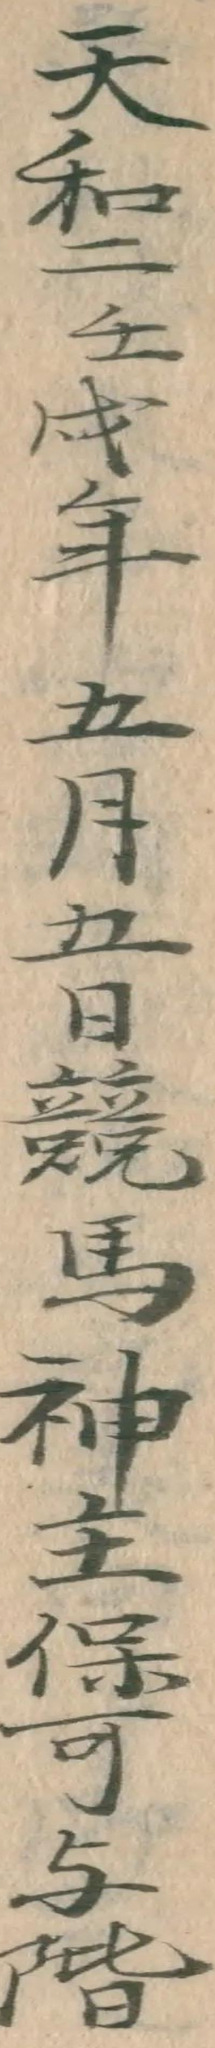天和二壬戌年五月五日競馬神主保可与階
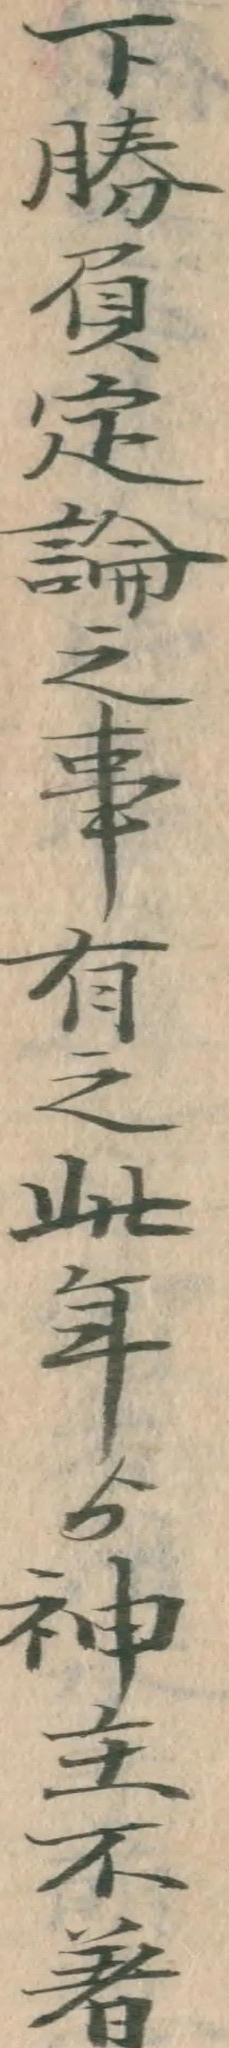下勝負定論之事有之此年ゟ神主不着
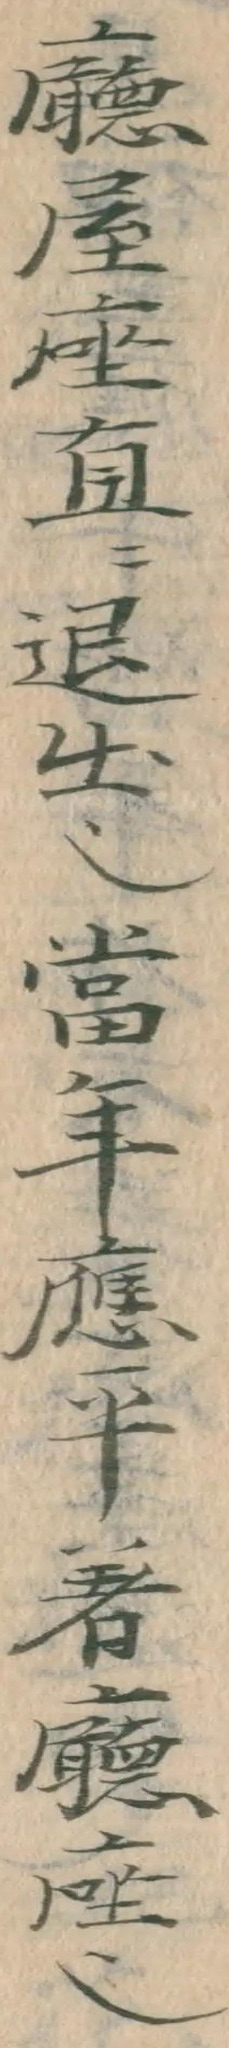庁屋座直ニ退出也当年応平着庁座也
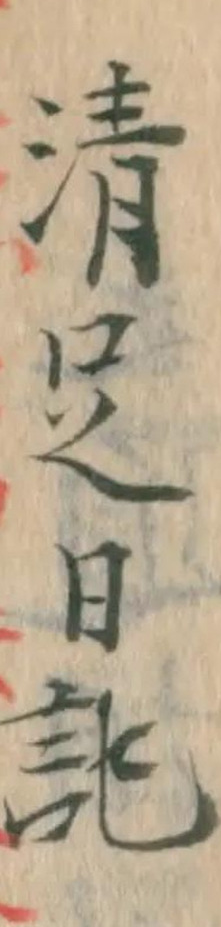清足日記
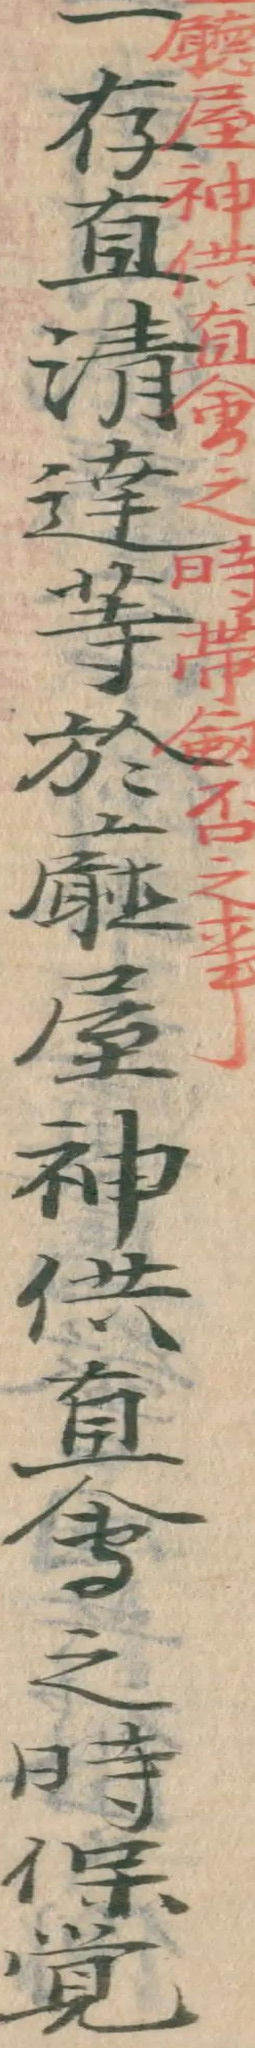一存直清達等於庁屋神供直会之時保覚
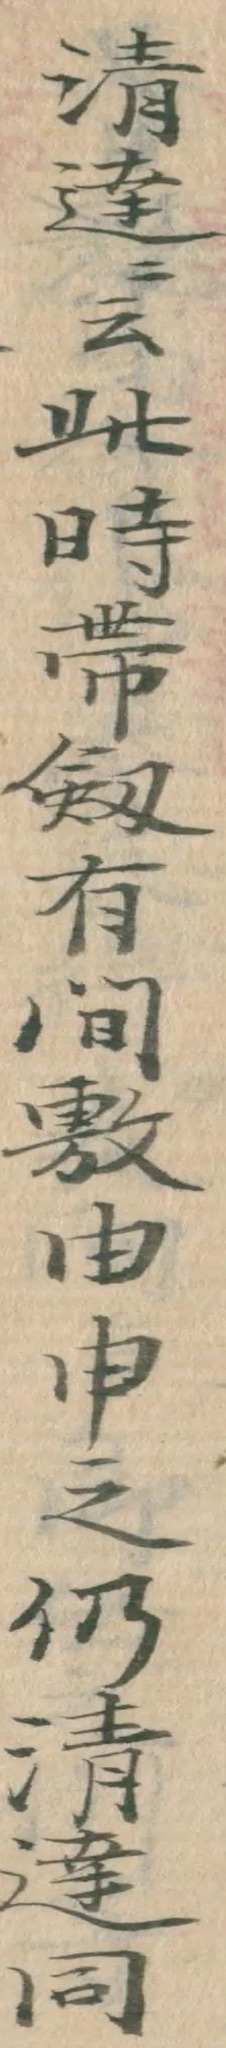清達ニ云此時帯剱有間敷由申之仍清達同
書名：賀茂社記録. 第10冊
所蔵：国立国会図書館 National Diet Library, JAPAN
